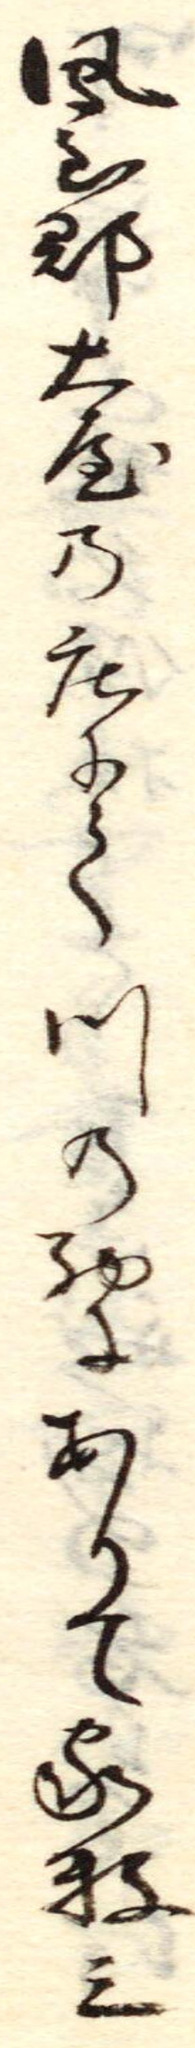鳳至郡大屋の庄にて川の西にありて家数三
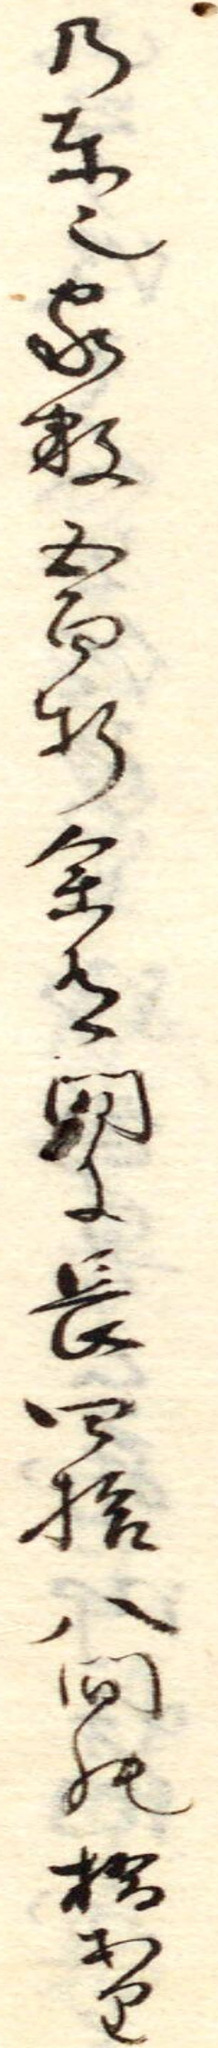の東也家数五百軒余有間に長四拾八間の橋あり
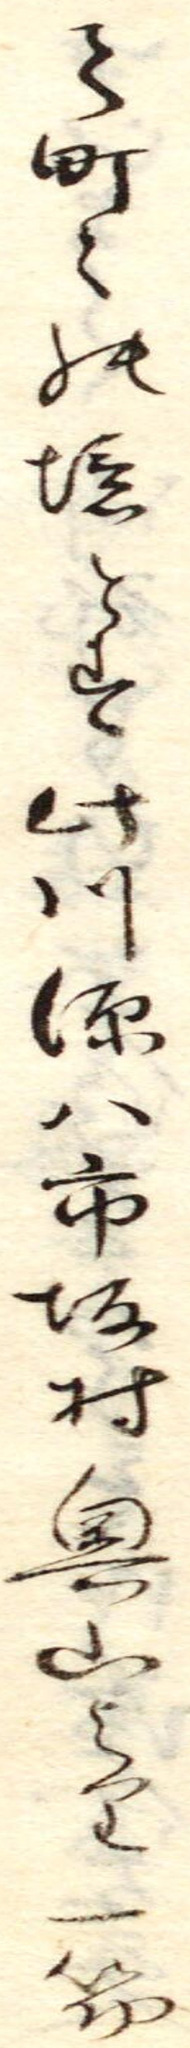て町々の境とす此川源は市坂村奥山より一筋
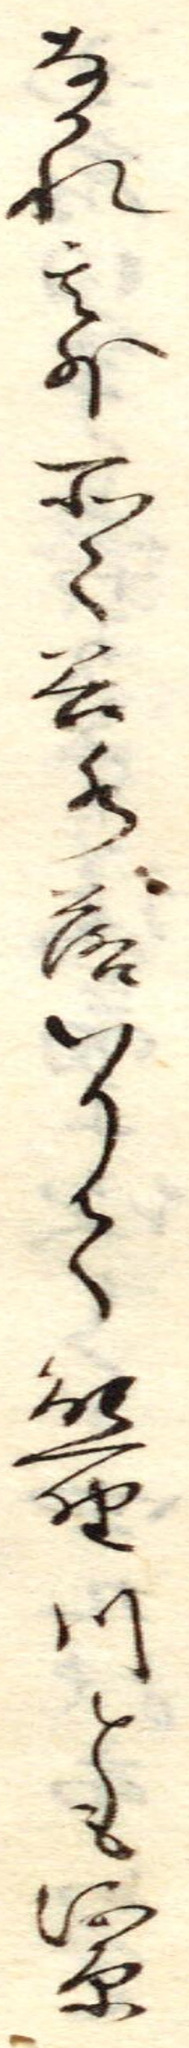なかれ其外所々谷水落いりて熊野川とも河原
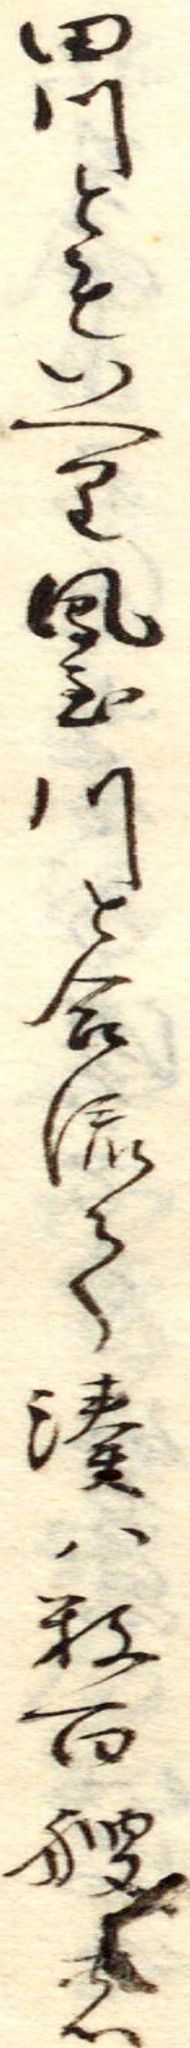田川ともいへり鳳至川と合流て湊は数百艘の

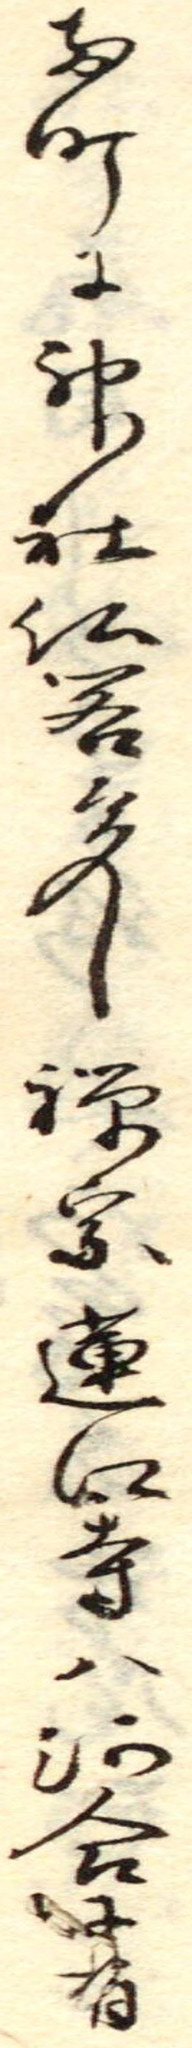両町に神社仏閣多し禅宗連江寺は河合に有
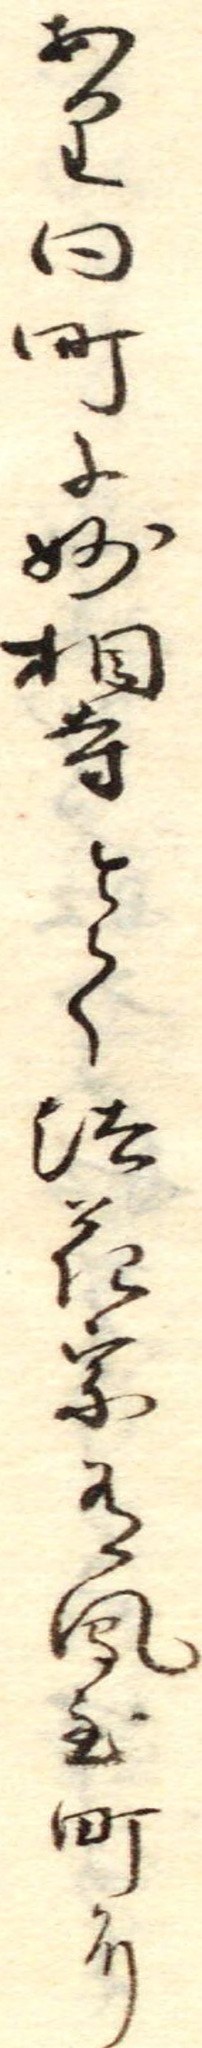あり同町に妙相寺とて法花宗有鳳至町に
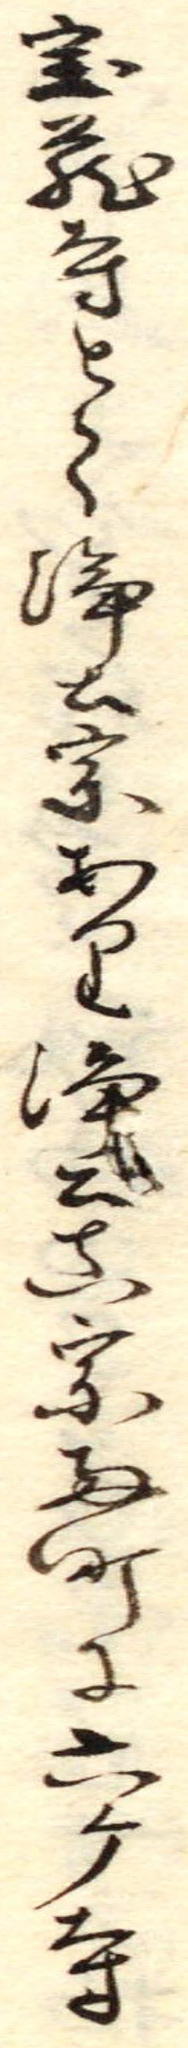宝蔵寺とて浄土宗あり浄土真宗両町に六ヶ寺
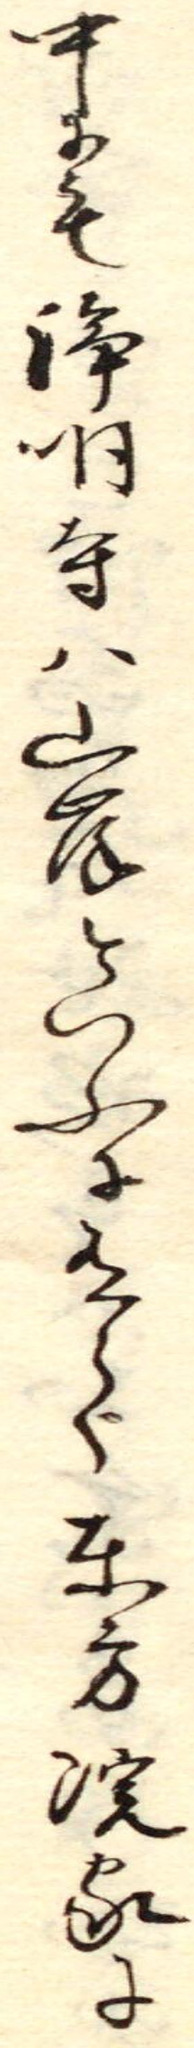中にも浄明寺は山岸といふに有之て東方院家に
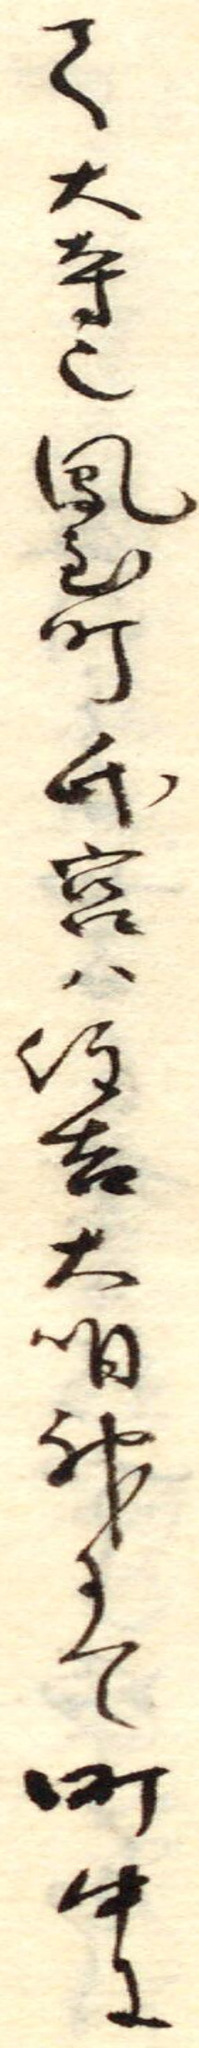て大寺也鳳至町氏宮は住吉大明神にて町中に
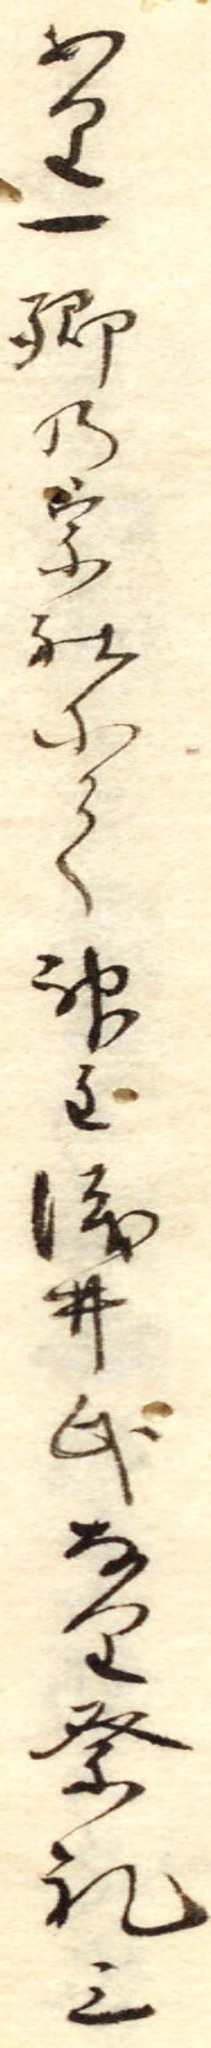あり一郷の宗社にて神主浅井氏なり祭礼三
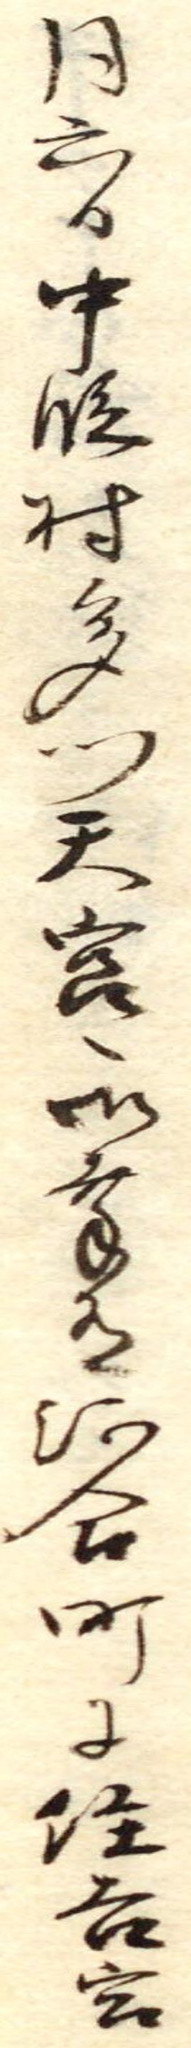月六日中段村多門天宮へ御幸有川合町に住吉宮
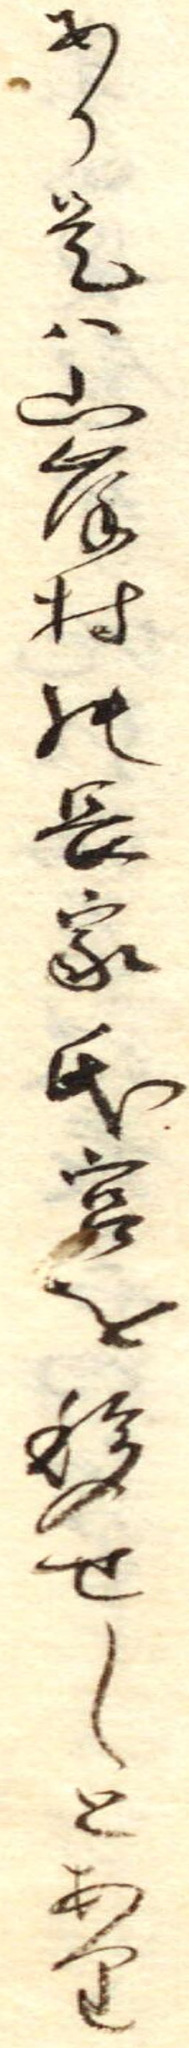あり是は山岸村の長家氏宮を移せしとあり
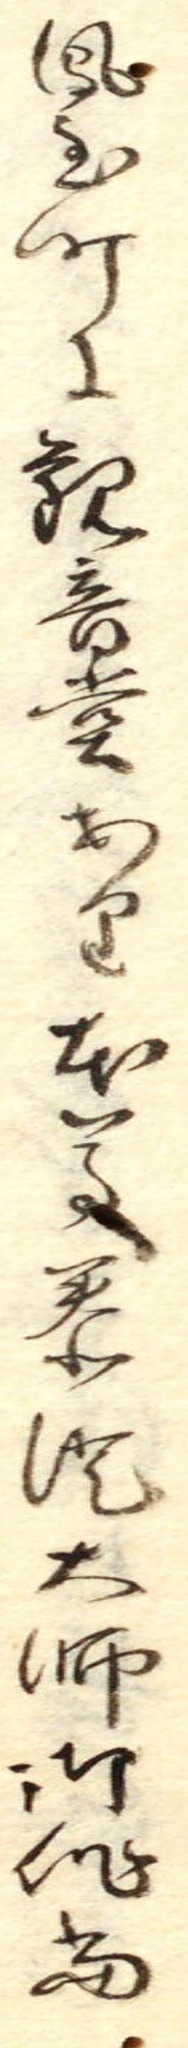鳳至町に観音堂あり本尊泰澄大師御作当
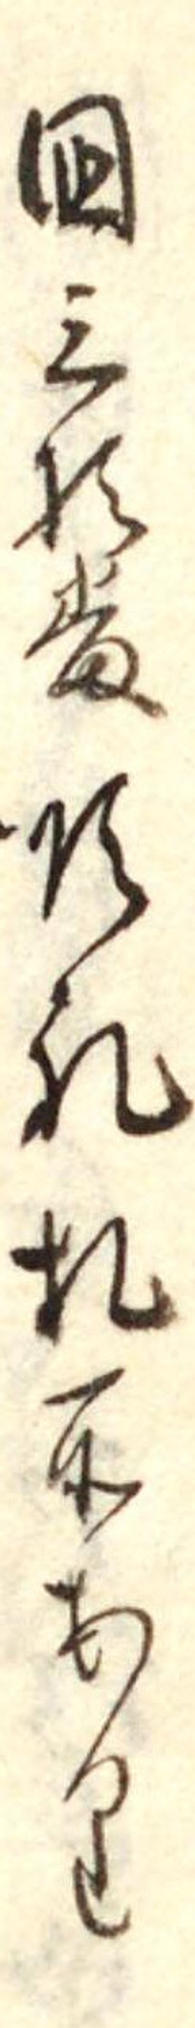国三拾番順礼札所あり
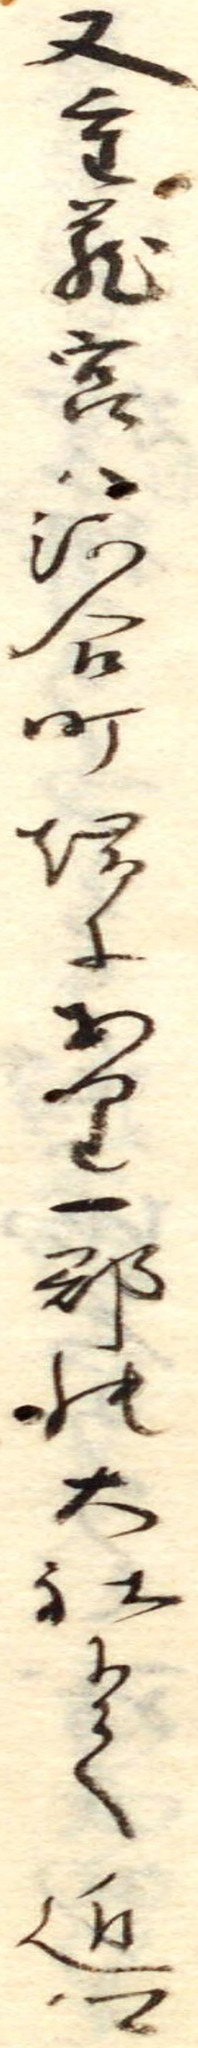又重蔵宮は川合町端にあり一郡の大社にて近郷
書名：能登名跡誌
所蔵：Ishikawa Prefectural Library
